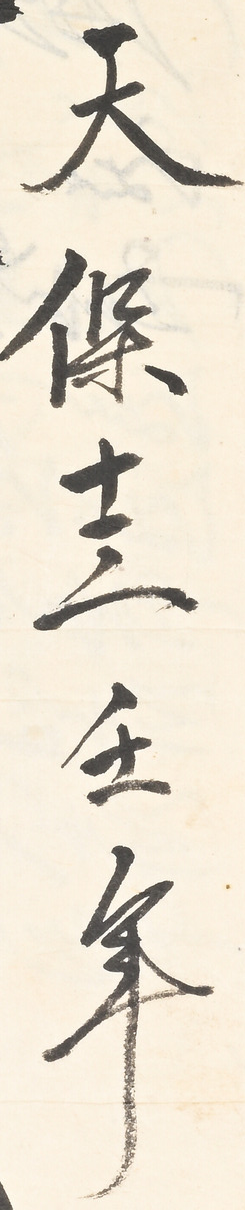天保十三壬年
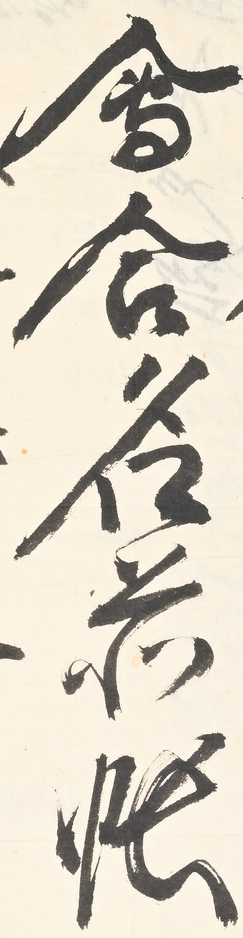会合名前帳
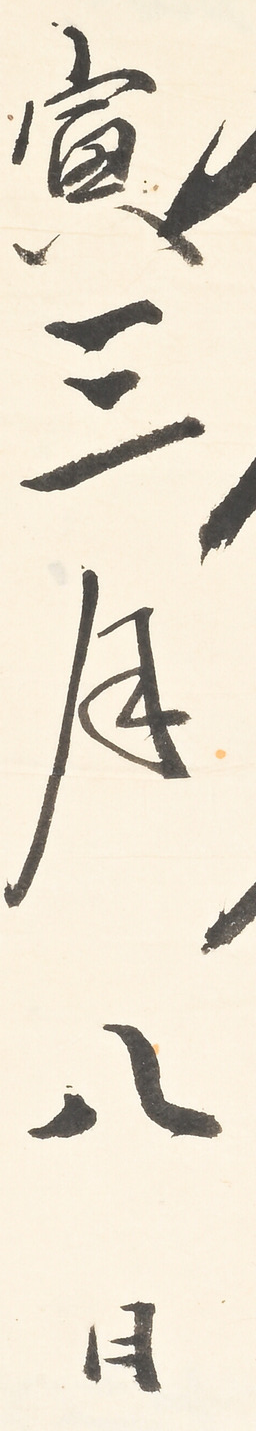寅三月八日

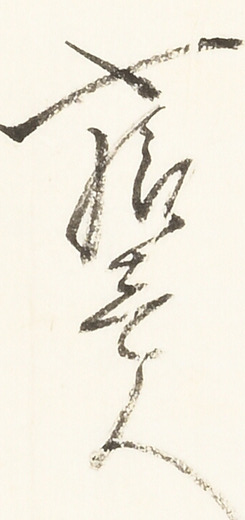〆拾壱人

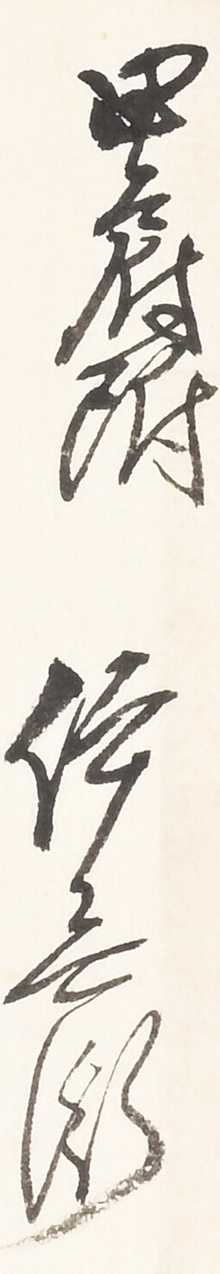甲府附伊兵衛
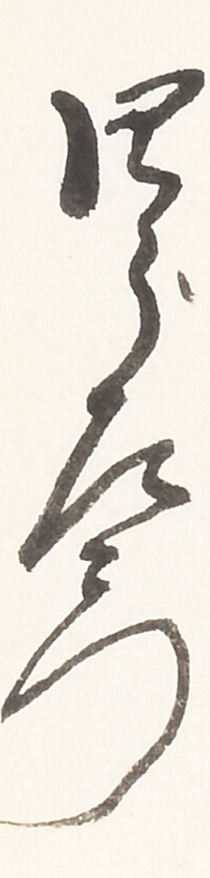四郎左衛門
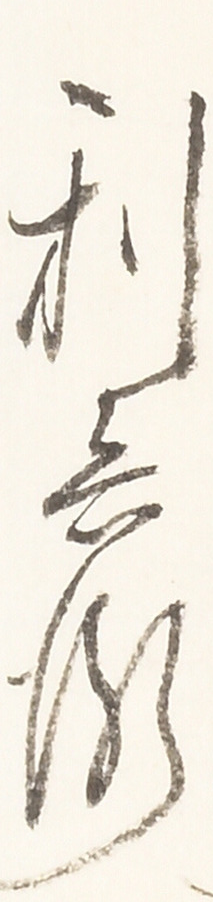利兵衛
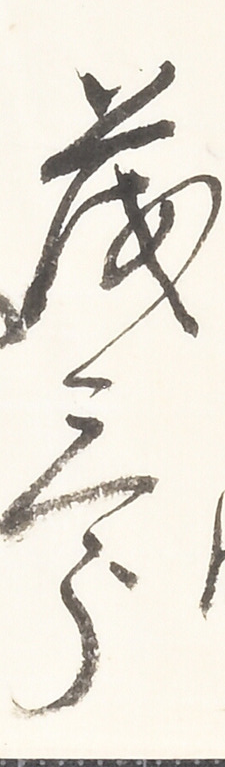茂三郎
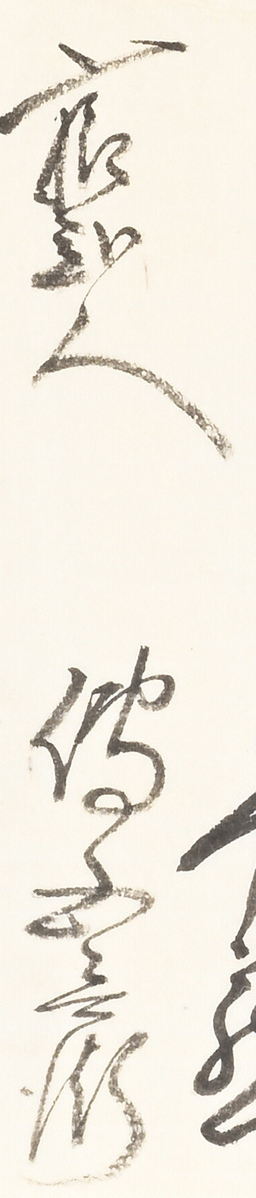〆拾弐人伝五兵衛

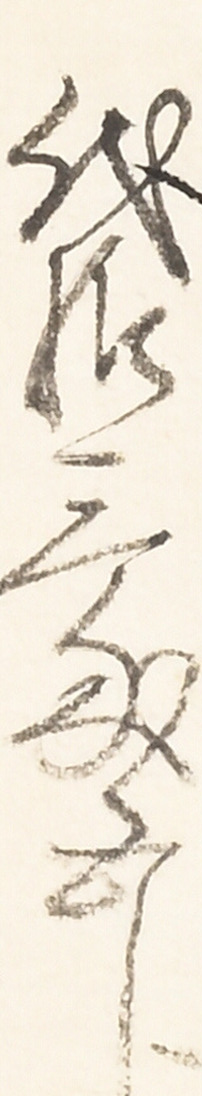代銀三匁五分
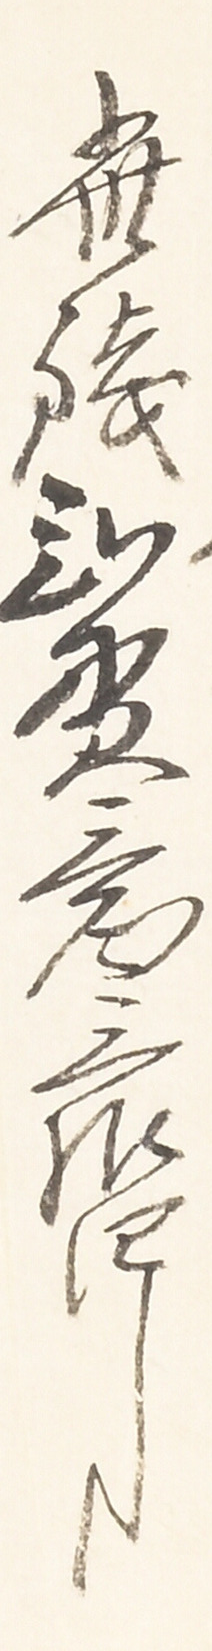此銭弐貫三百三拾四文
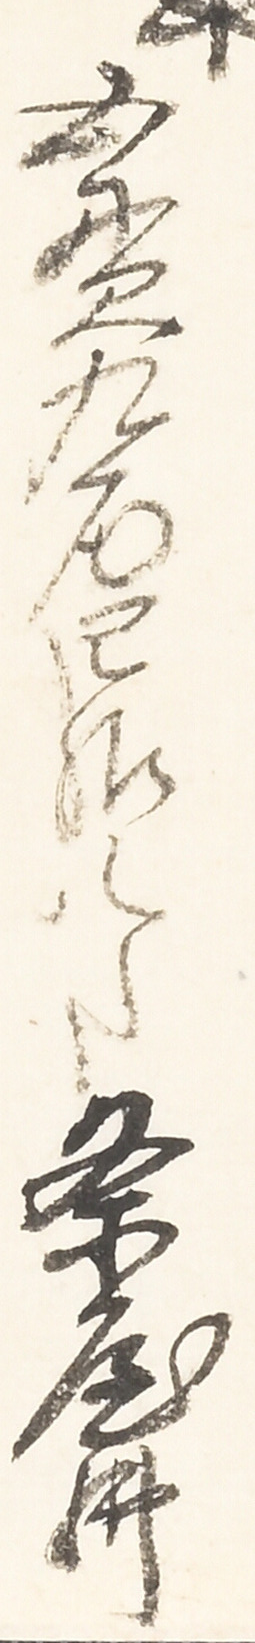五貫九百四拾八文粂屋払
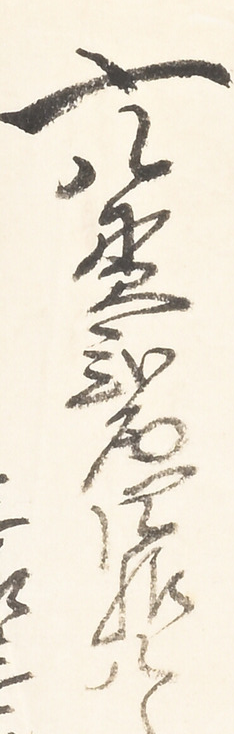〆八貫弐百四拾八文
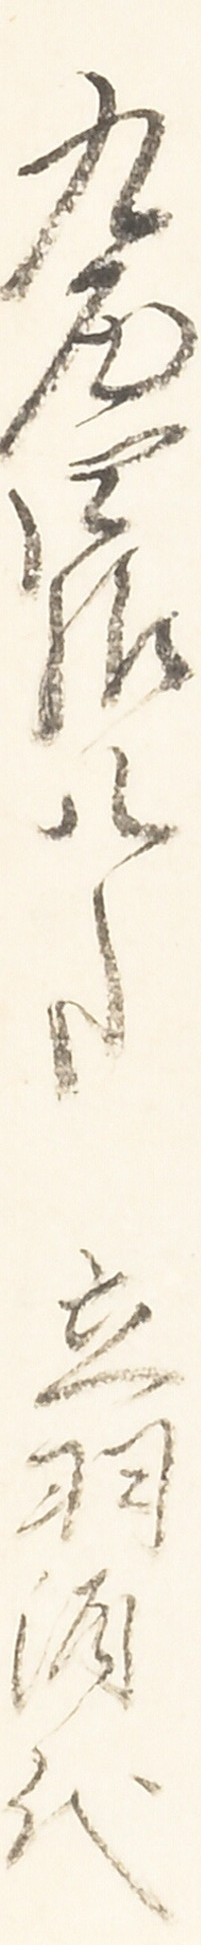九百四拾八文立羽酒代
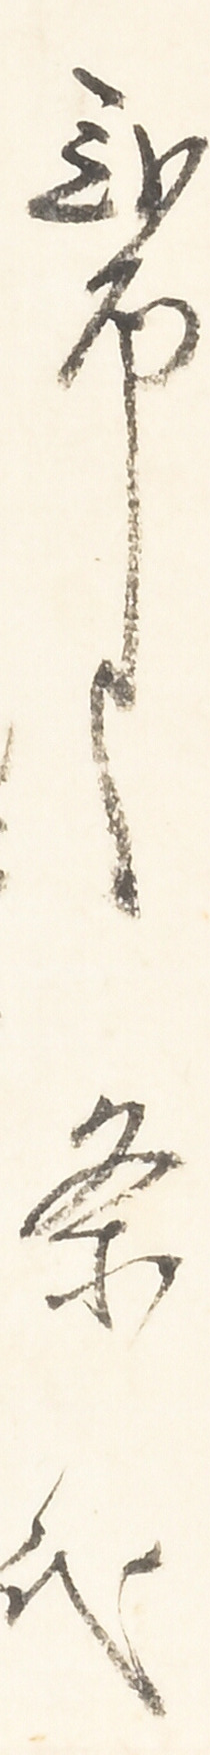弐百文条代
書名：天保十三壬年寅三月八日會合名前帳
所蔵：伊那市立高遠町図書館・合同会社AMANE
